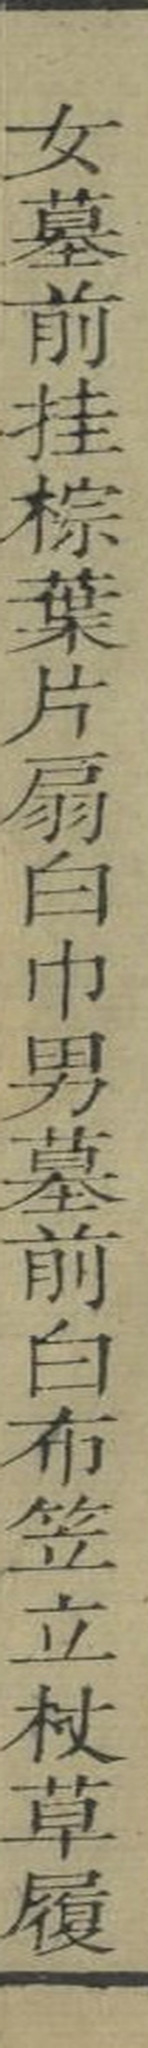女墓前挂棕葉片扇白巾男墓前白布笠立杖草履
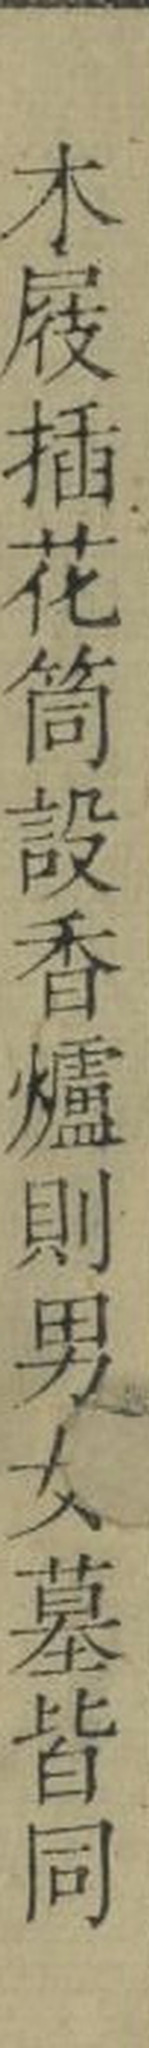木屐揷花筒設香炉則男女墓皆同
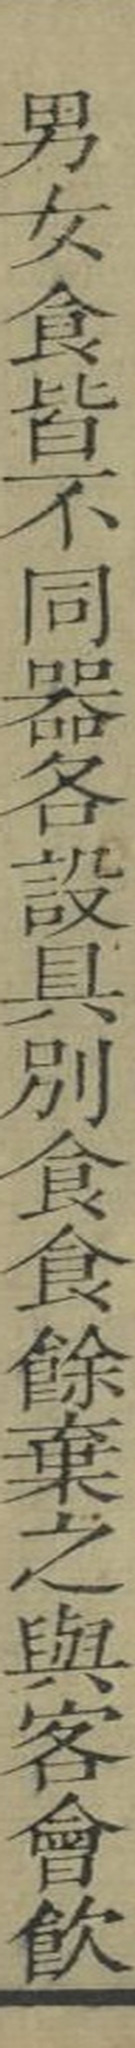男女食皆不同器各設具別食食余棄之与客会飲
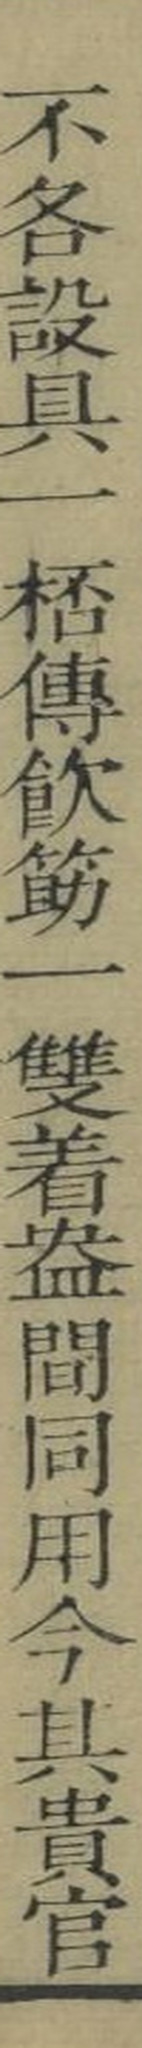不各設具一杯伝飲筯一双着盎間同用今其貴官
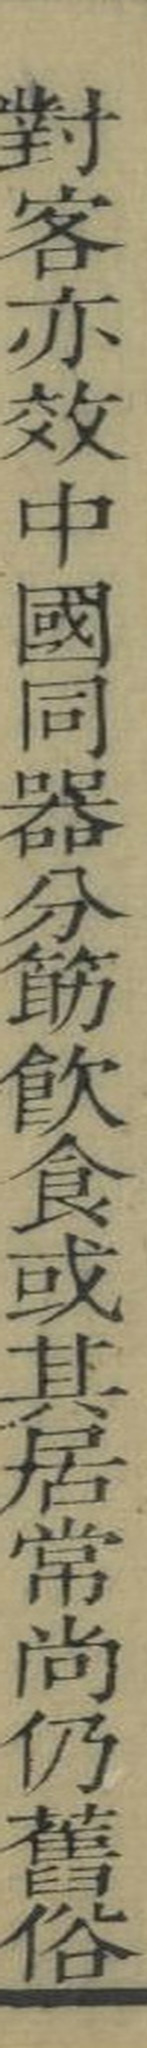対客亦效中国同器分筯飲食或其居常尚仍旧俗
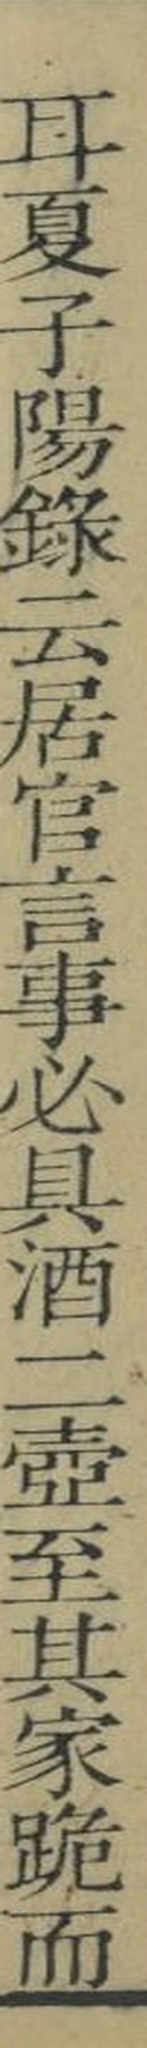耳夏子陽録云居官言事必具酒二壺至其家跪而
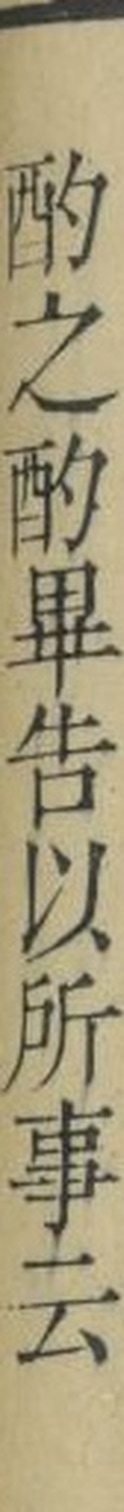酌之酌畢告以所事云
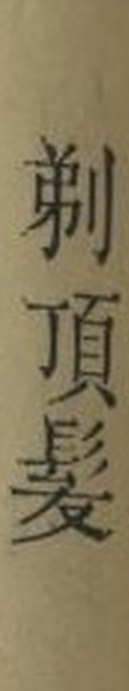剃頂髪
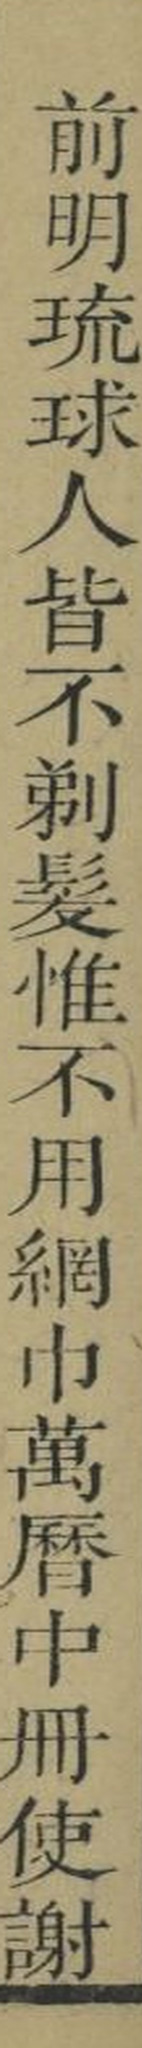前明琉球人皆不剃髪惟不用網巾万暦中冊使謝
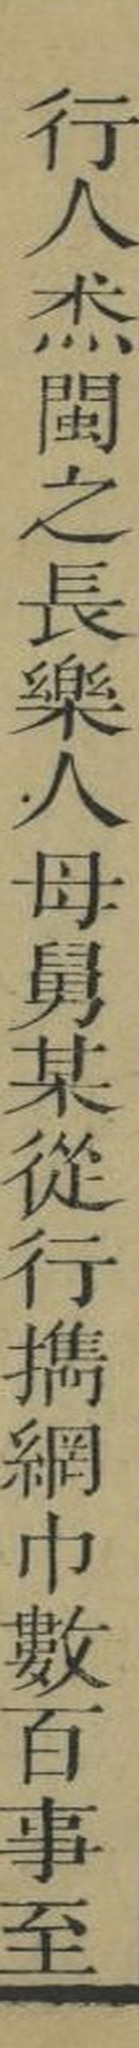行人杰閩之長楽人母舅某従行携網巾数百事至
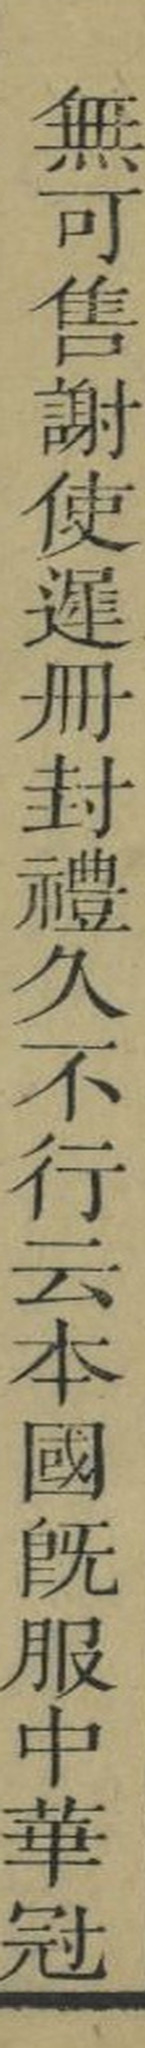無可售謝使遅冊封礼久不行云本国既服中華冠
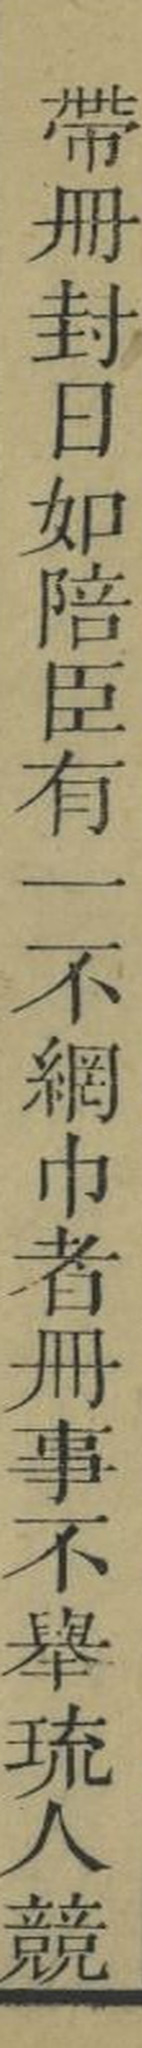帯冊封曰如陪臣有一不網巾者冊事不挙琉人競
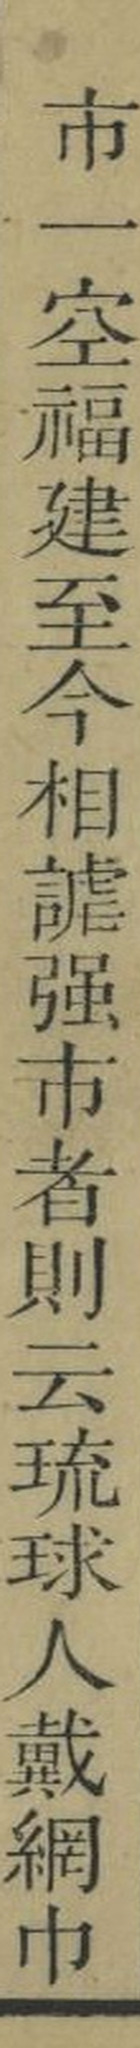市一空福建至今相謔強市者則云琉球人戴網巾
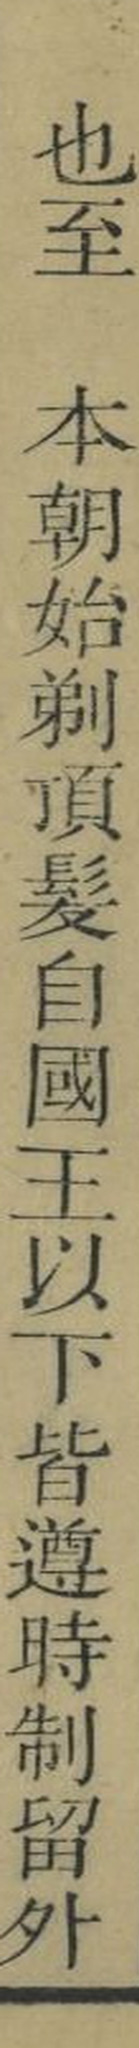也至本朝始剃頂髪自国王以下皆遵時制留外
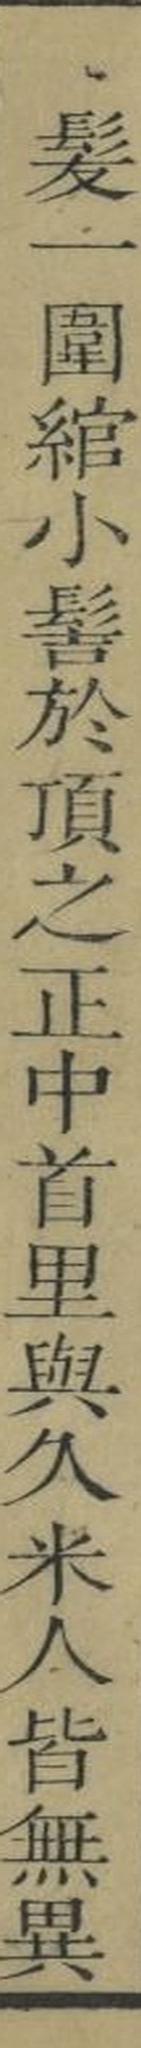髪一囲綰小髻於頂之正中首里与久米人皆無異
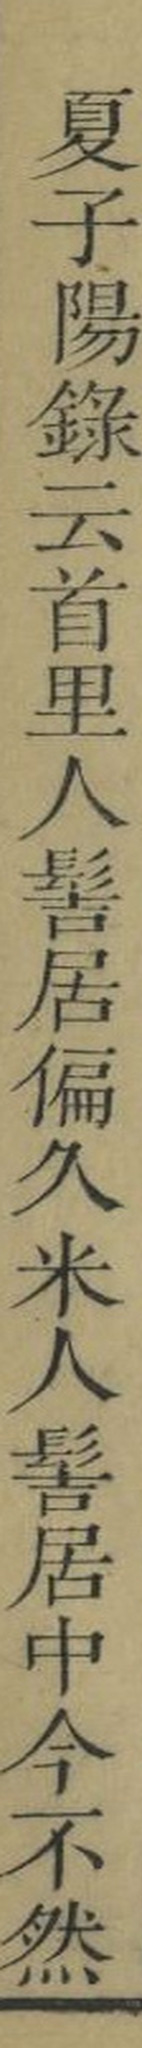夏子陽録云首里人髻居偏久米人髻居中今不然
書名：中山伝信録 巻六
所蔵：University of the Ryukyus Library
